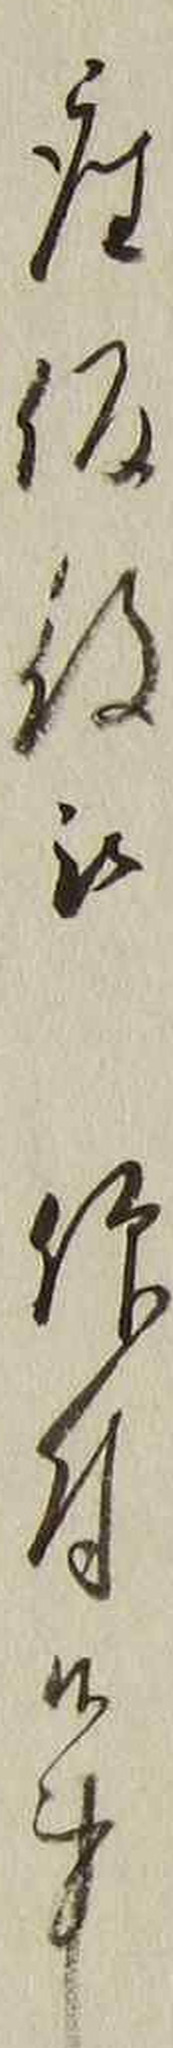座仮役被仰付候事
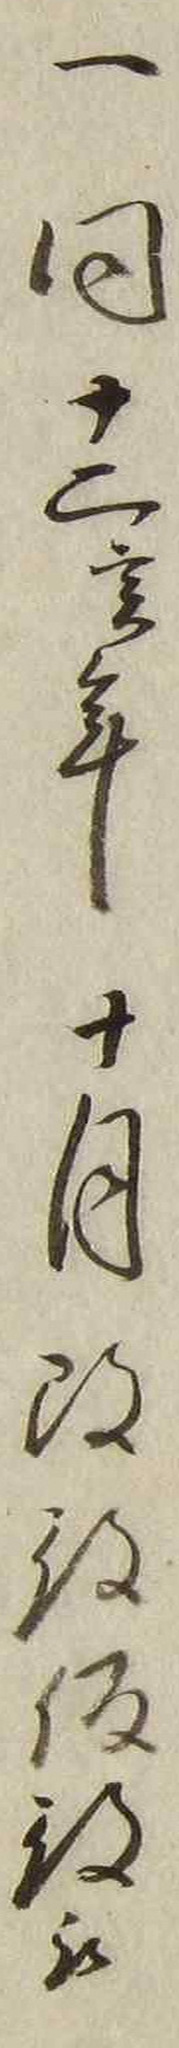一同十二亥年十月改役仮役被
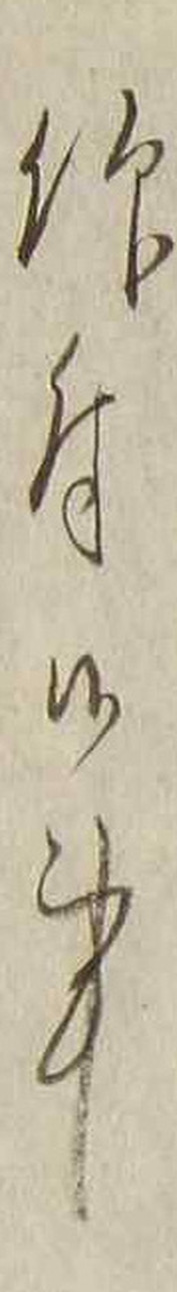仰付候事

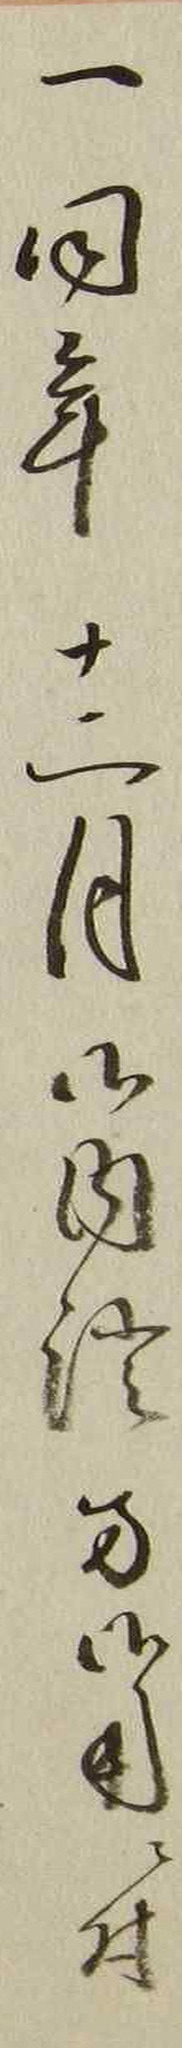一同年十二月御内證方御用ニ付
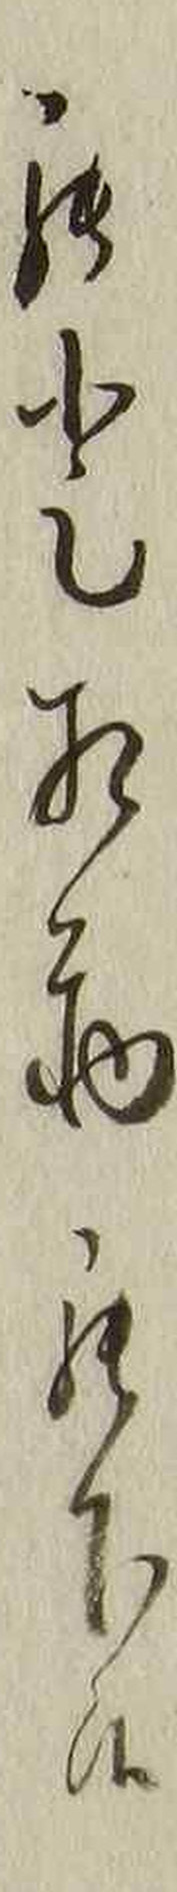罷登相勤罷下候
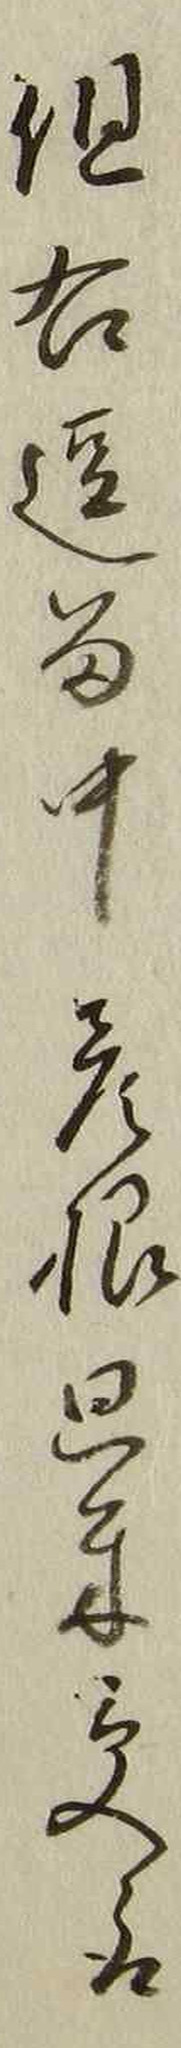但右逗留中彦根廻米受取
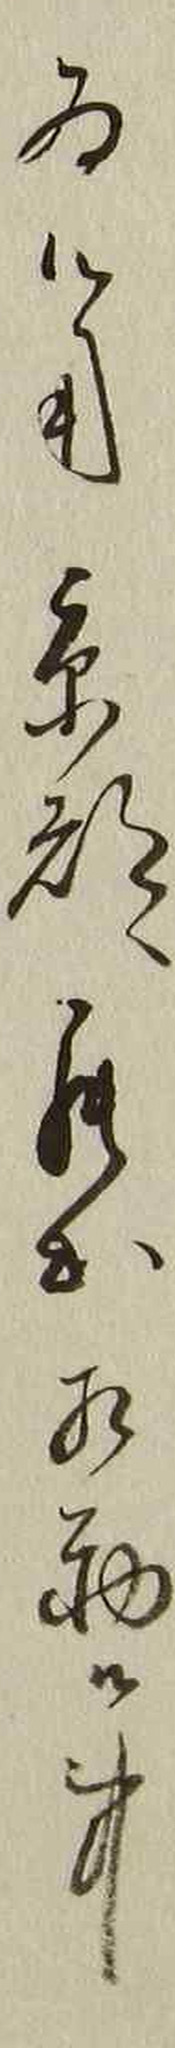為御用京都へ罷出相勤候事
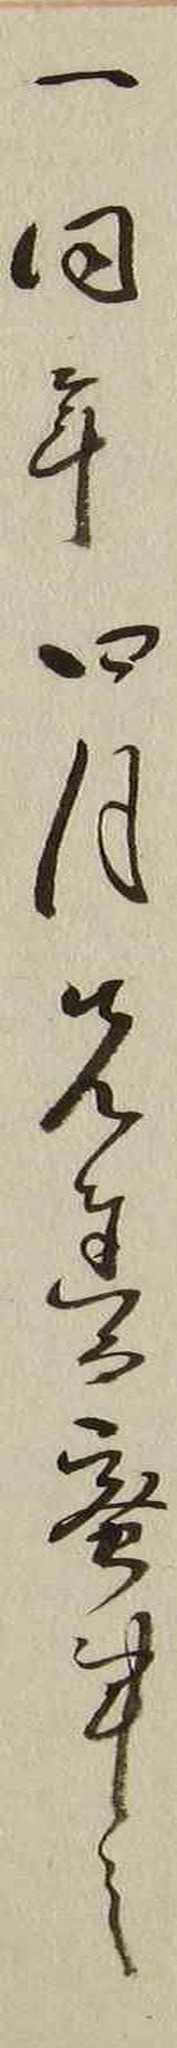一同年四月先達而蜜事之
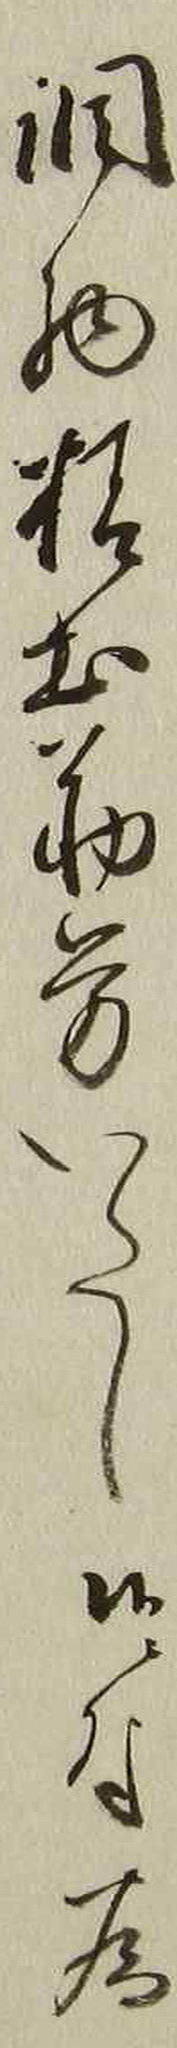調物精出勤労いたし候ニ付為
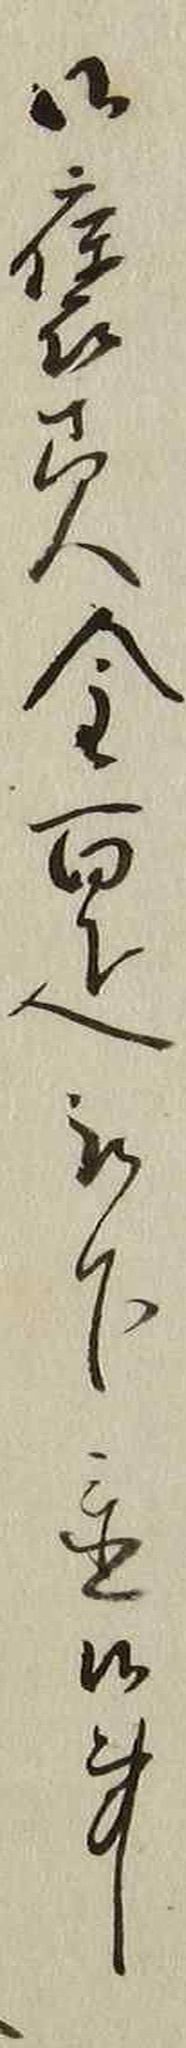御褒美金百疋被下置候事
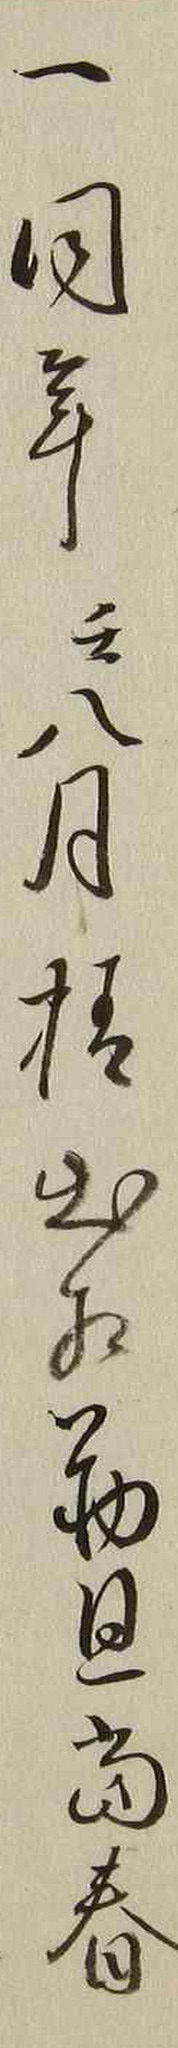一同年閏八月精出相勤旦当春
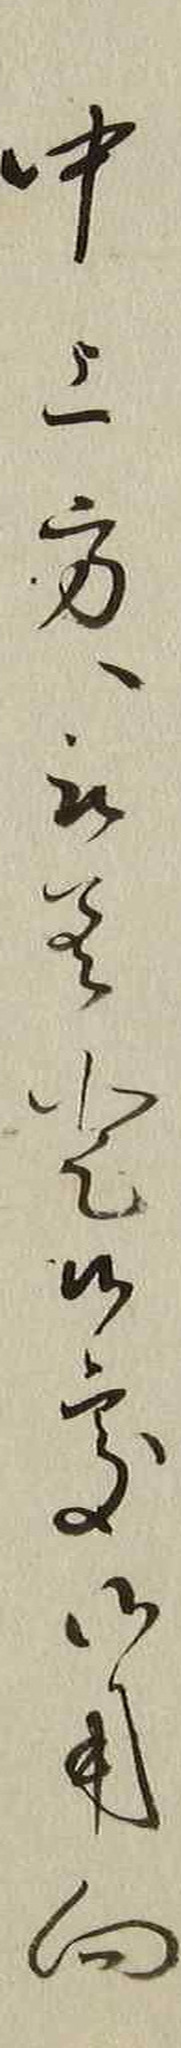中上方へ被差登候処御用向
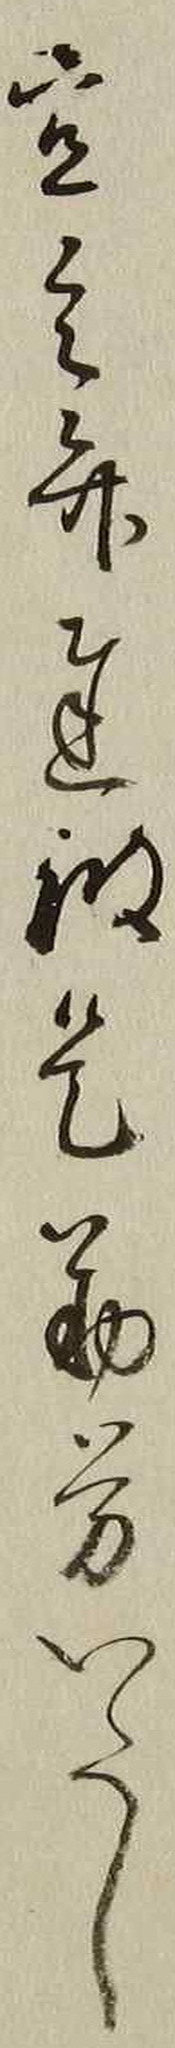宜令弁達彼是勤労いたし
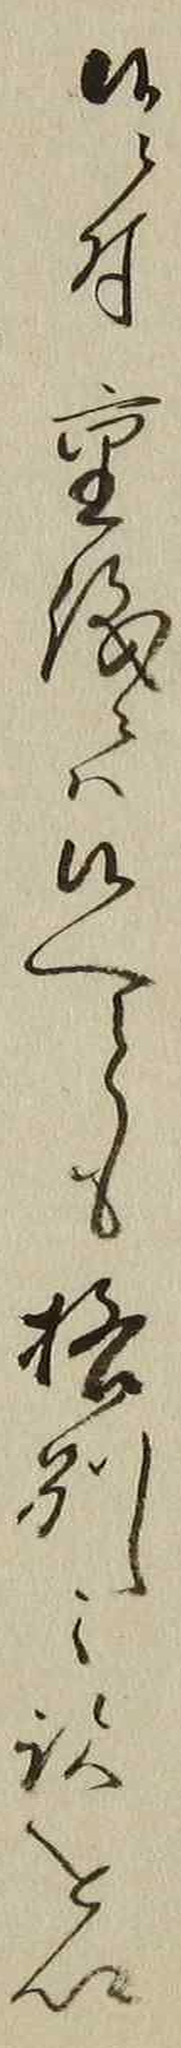候ニ候付重儀ニハ候へとも格別之訳を以
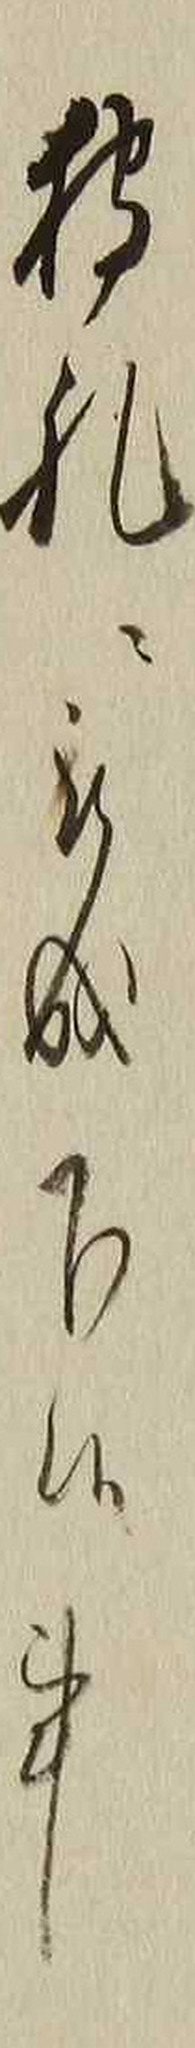独礼ニ被成下候事
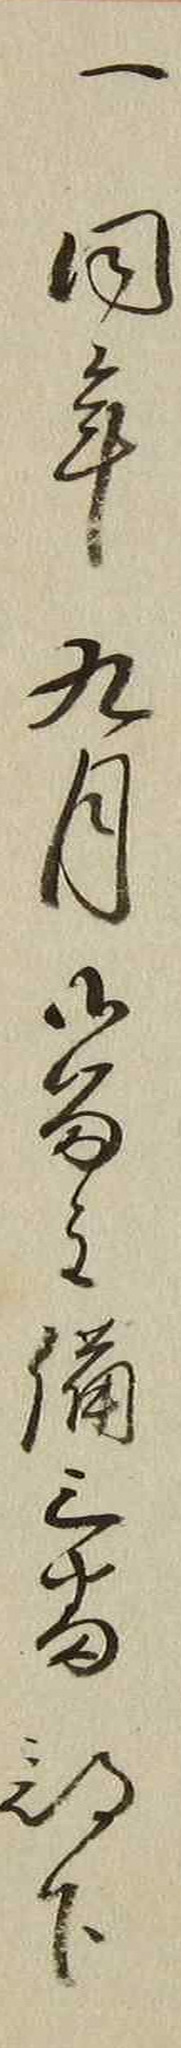一同年九月御留守備三番部下
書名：諸士系譜　巻之132　た之部8
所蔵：会津若松市立会津図書館
